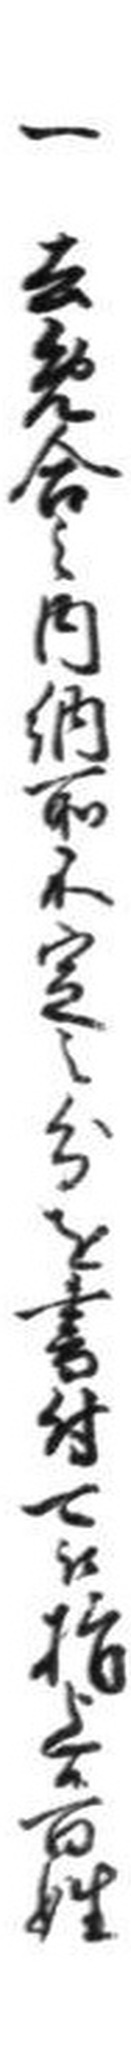一去免合之内納所不定之分を書付可被指上候百姓
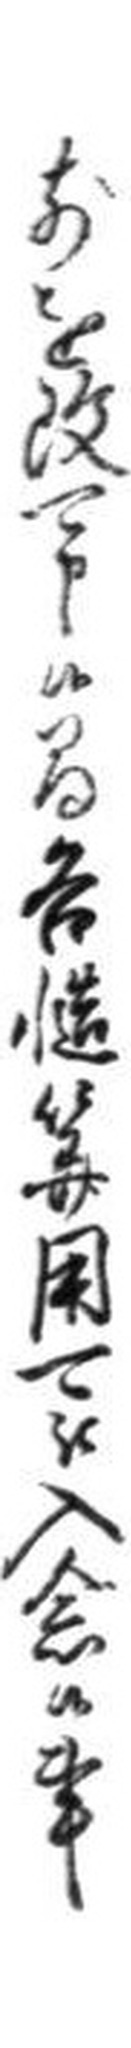前を改可申候間各慥算用可被入念候事
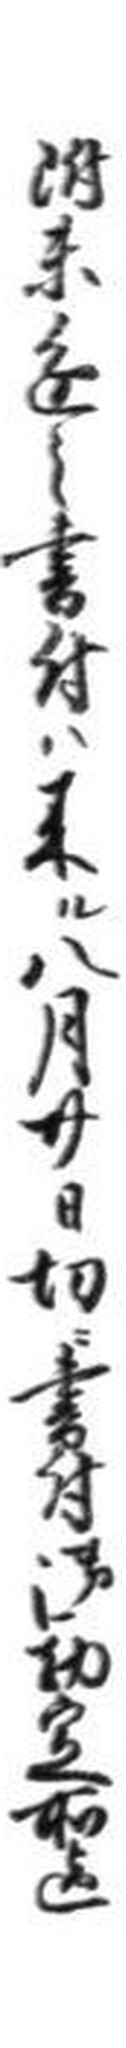附未進之書付ハ来ル八月廿日切ニ書付御勘定所迄
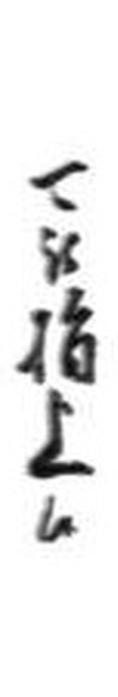可被指上候
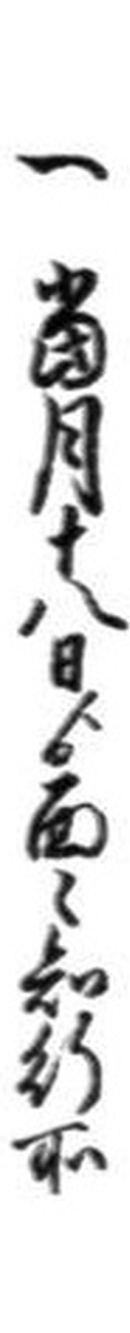一当月十八日ゟ面々知行所
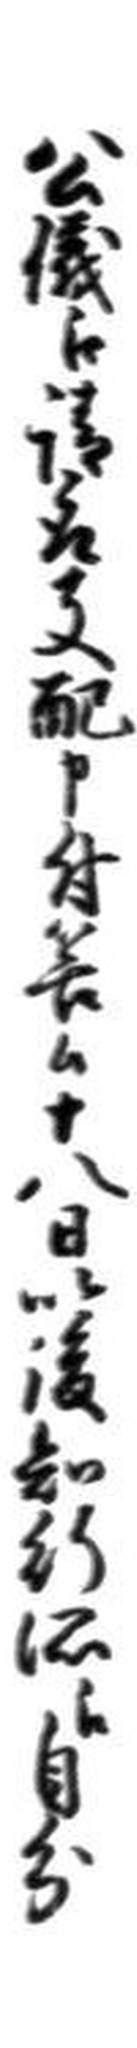公儀江請取支配申付筈候十八日以後知行所江自分
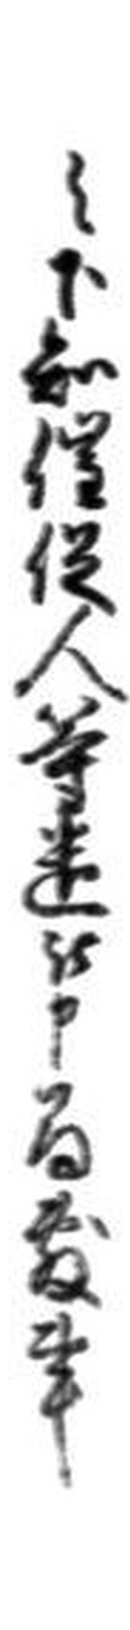之下知催促人等遣被申間敷事
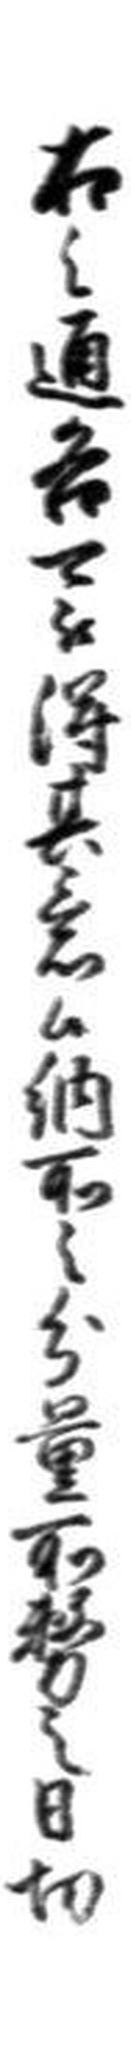右之通各可被得其意候納所之分量所務之日切
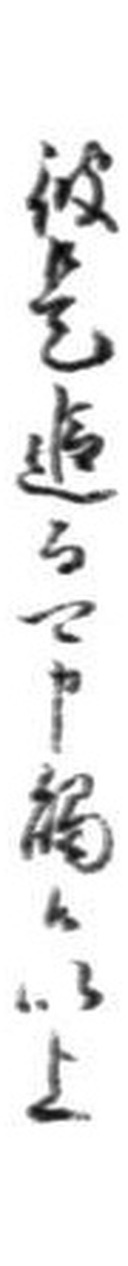彼是追而可申触候以上
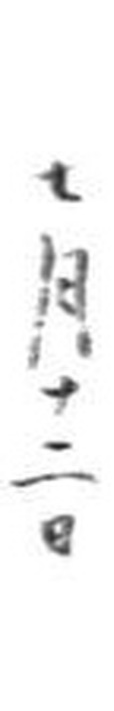七月十二日
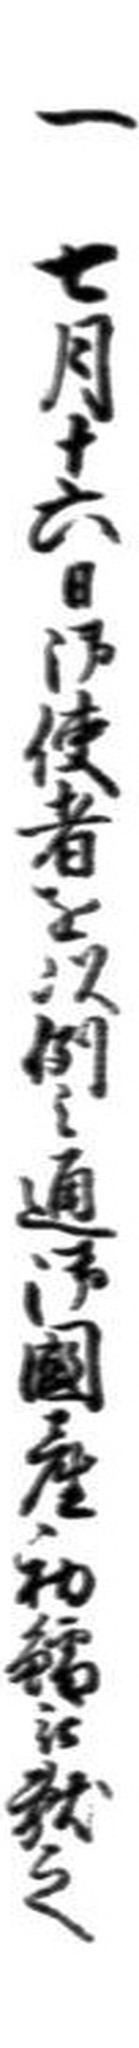一七月十六日御使者を以例之通御国産初鱈被献之
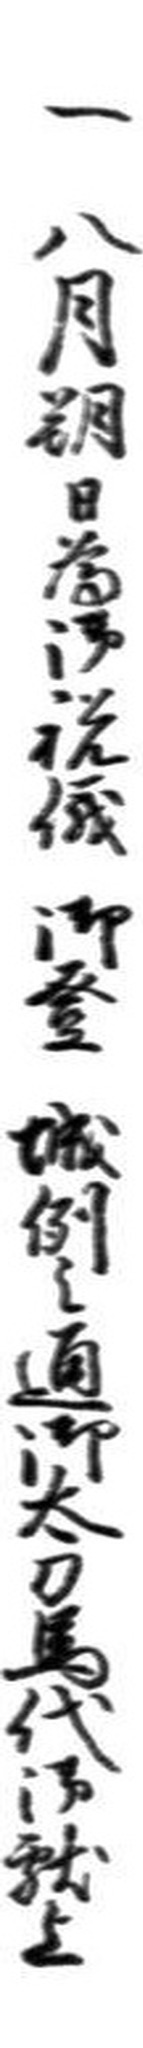一八月朔日為御祝儀御登城例之通御太刀馬代御献上

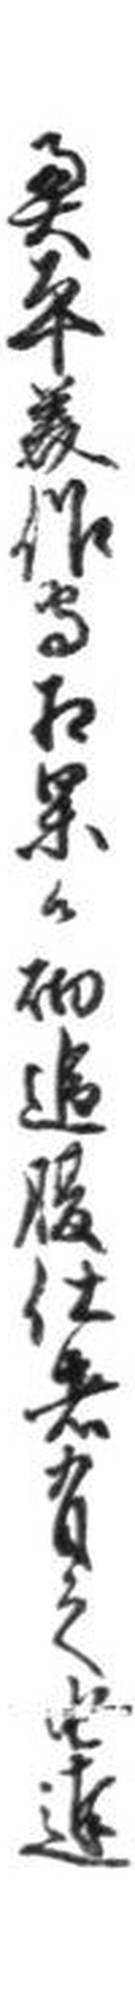奥平美作守相果候砌追腹仕者有之由達
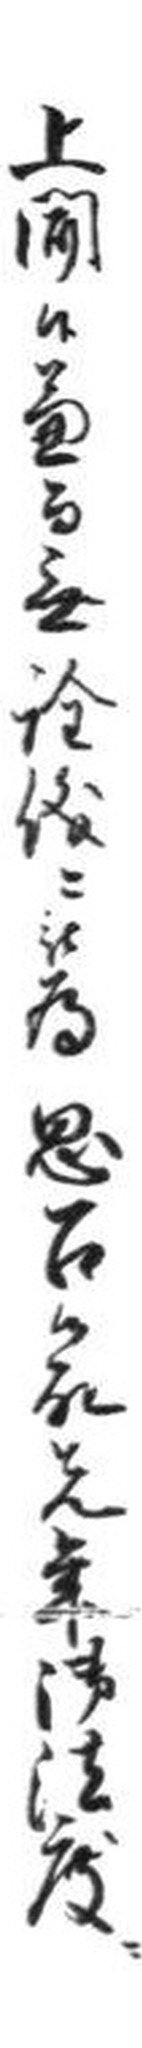上聞候兼而無詮儀ニ被為思召候故先年御法度ニ
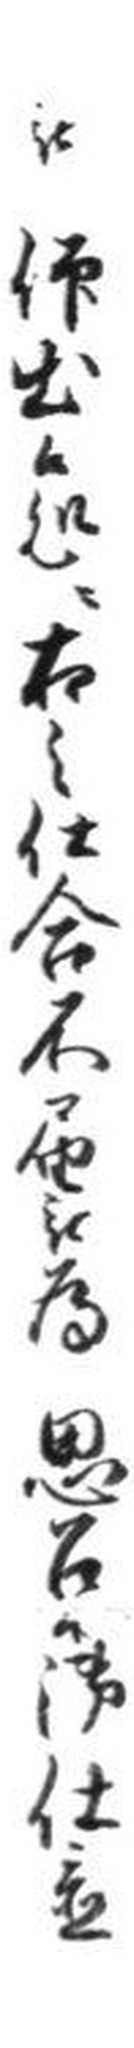被仰出候処ニ右之仕合不届被為思召候御仕置
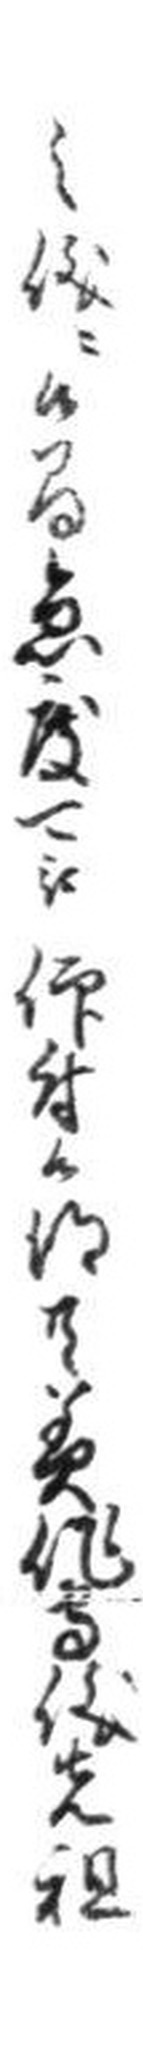之儀ニ候間急度可被仰付候得共美作守儀先祖
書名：家譜 七 光通公 従寛文四年到同九年
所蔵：福井県文書館 Fukui Prefectural Archives
